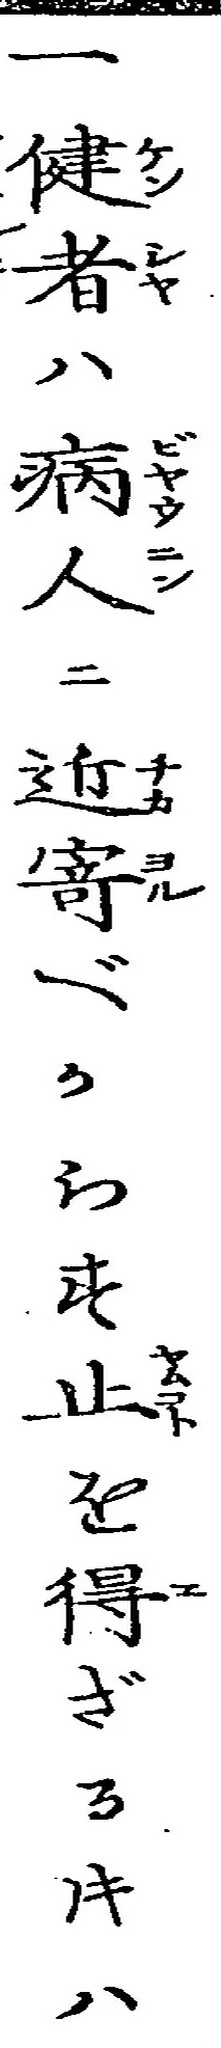一健者は病人に近寄べからす止を得ざるときは
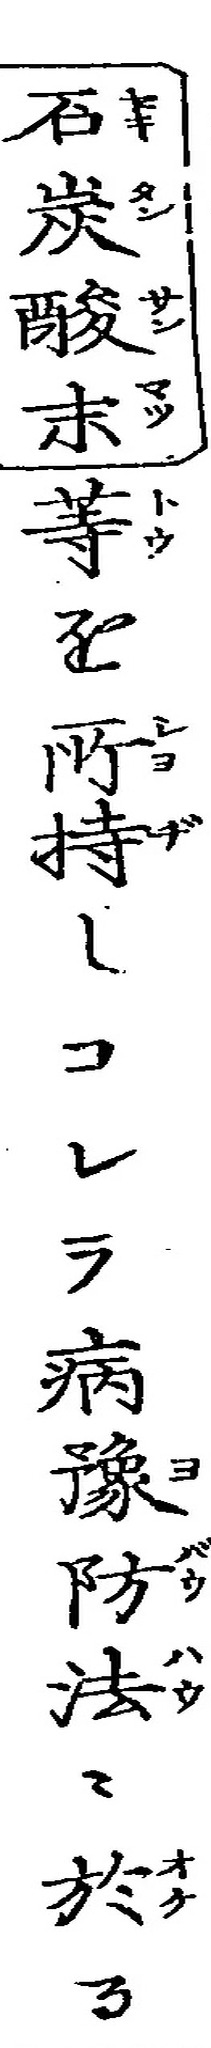「石炭酸末」等を所持しコレラ病予防法に於る
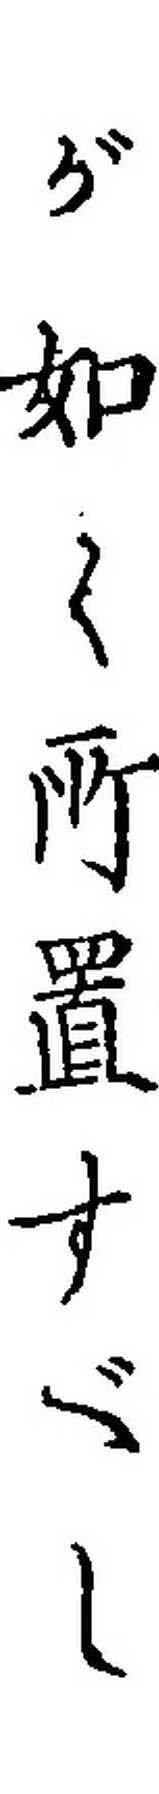が如く所置すべし
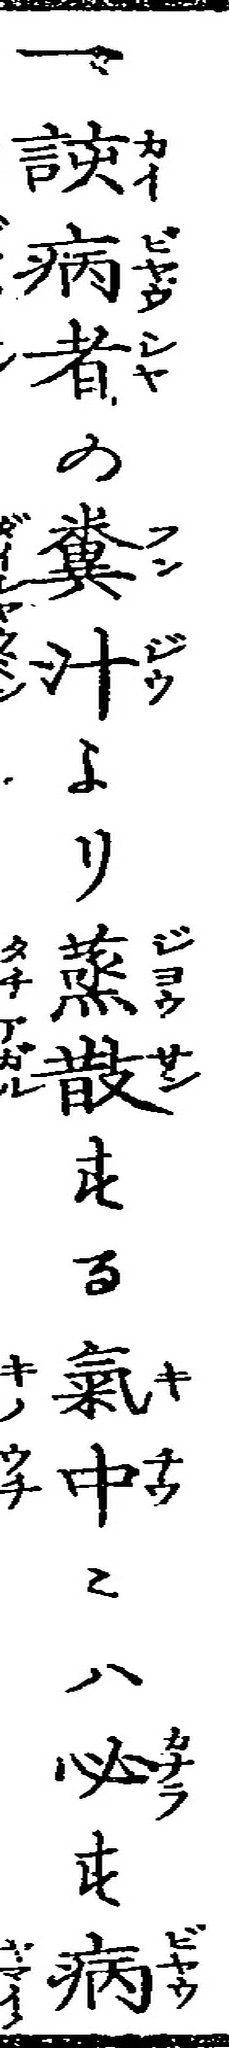一該病者の糞汁より蒸散する気中には必す病
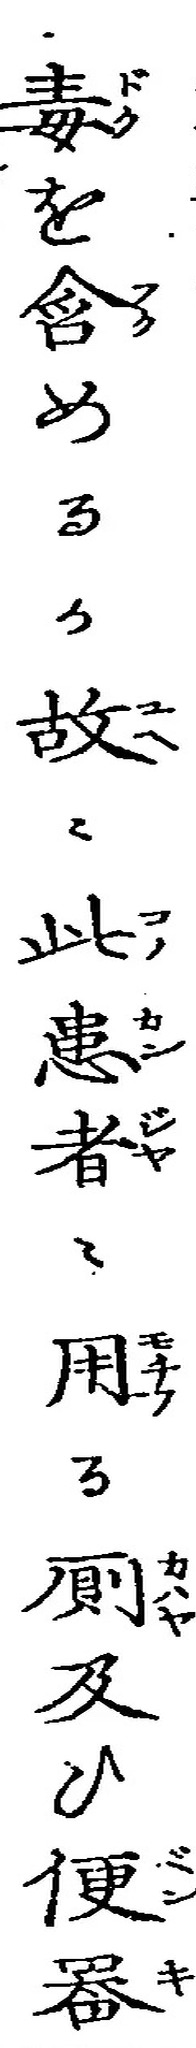毒を含めるか故に此患者に用る厠及ひ便器
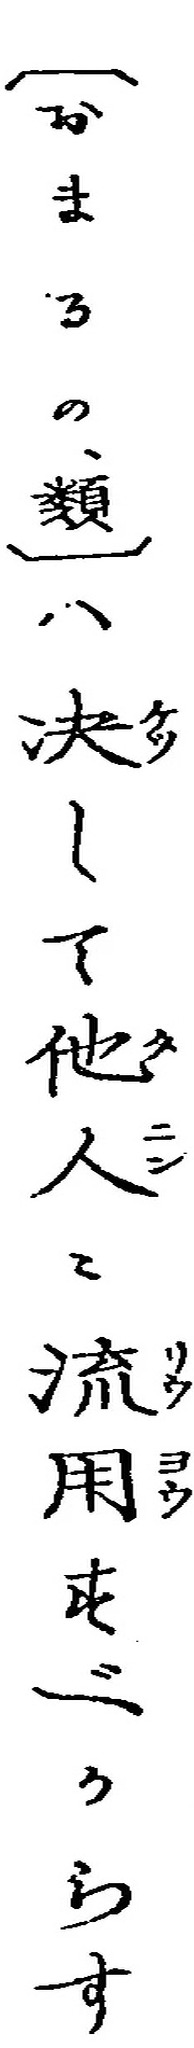[おまるの、類]は決して他人に流用すべからす
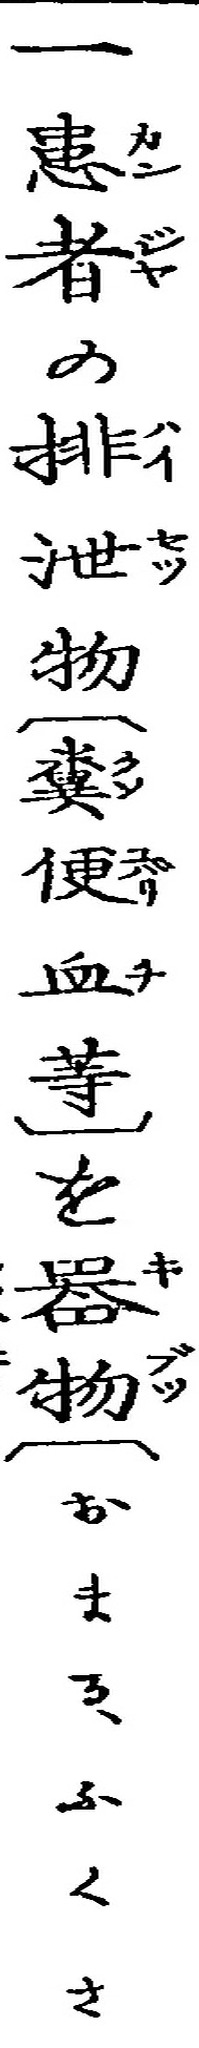一患者の排泄物[糞便血等]を器物[おまる、ふくさ

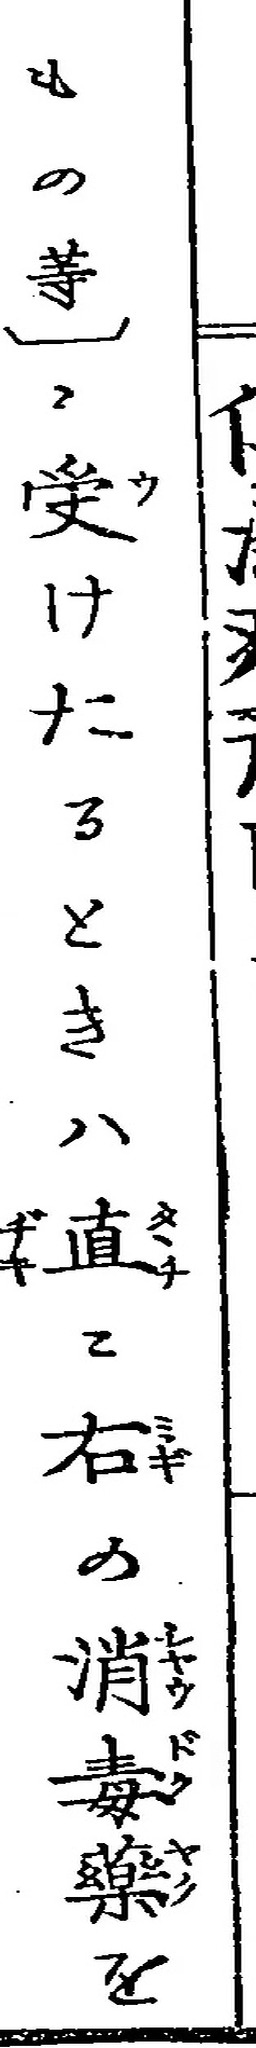もの等]に受けたるときは直に右の消毒薬を
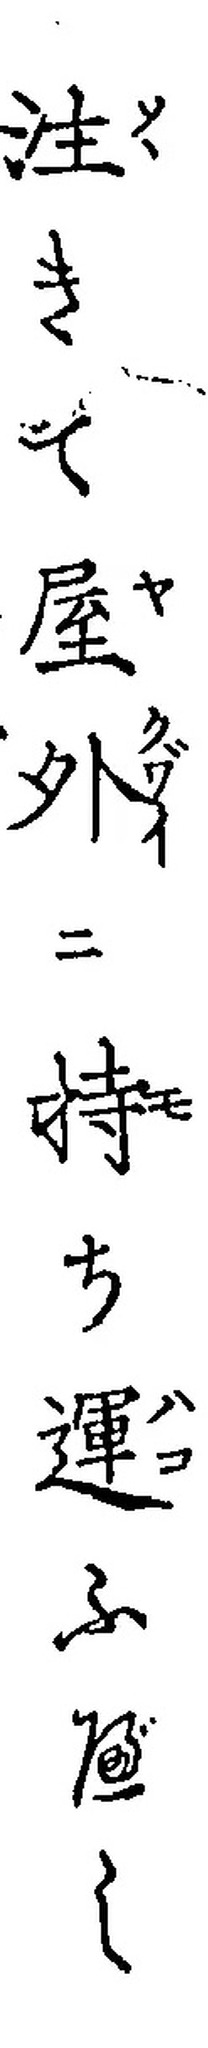注きて屋外に持ち運ふべし
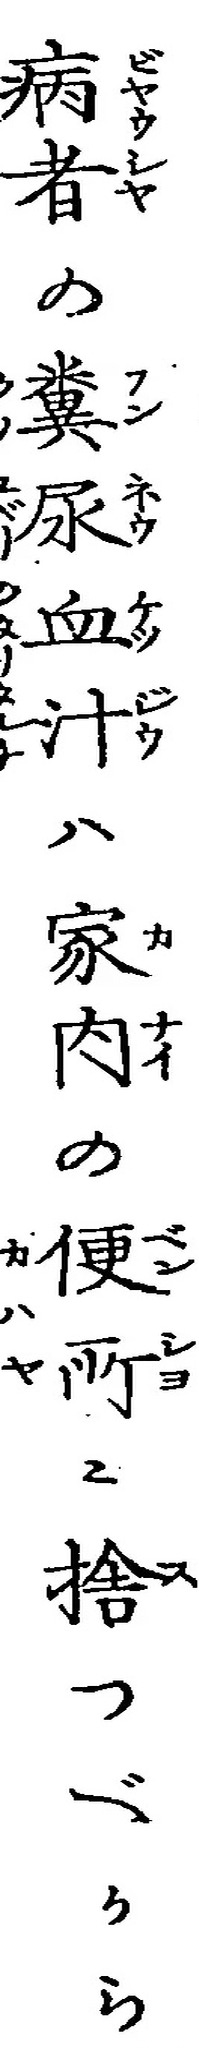病者の糞尿血汁は家内の便所に捨つべから
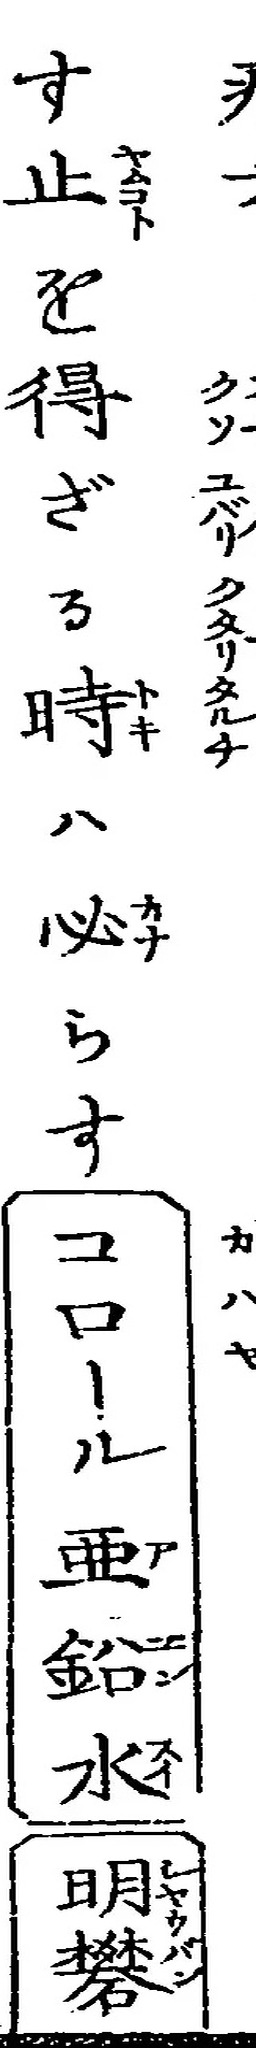す止を得ざる時は必らす「コロール亜鉛水」「明礬
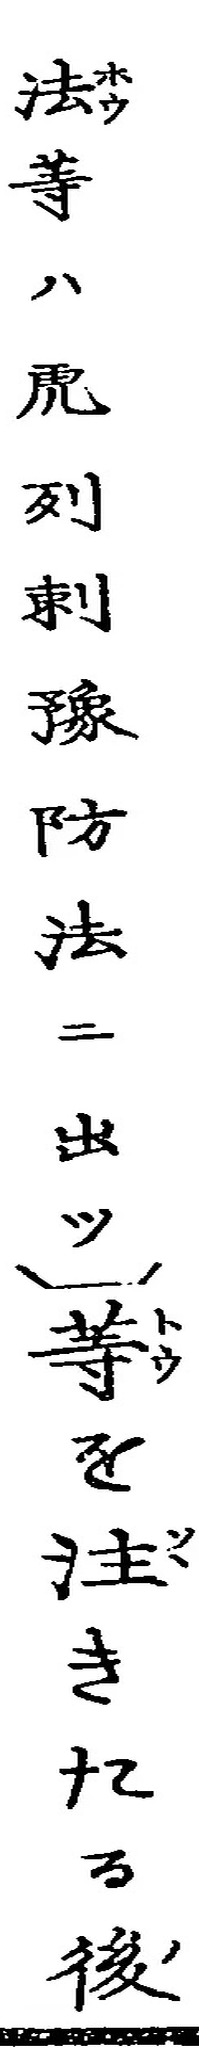法等ハ虎列刺予防法ニ出ツ]等を注きたる後
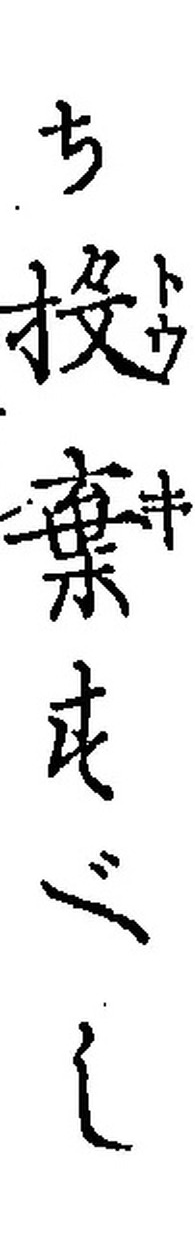ち投棄すべし
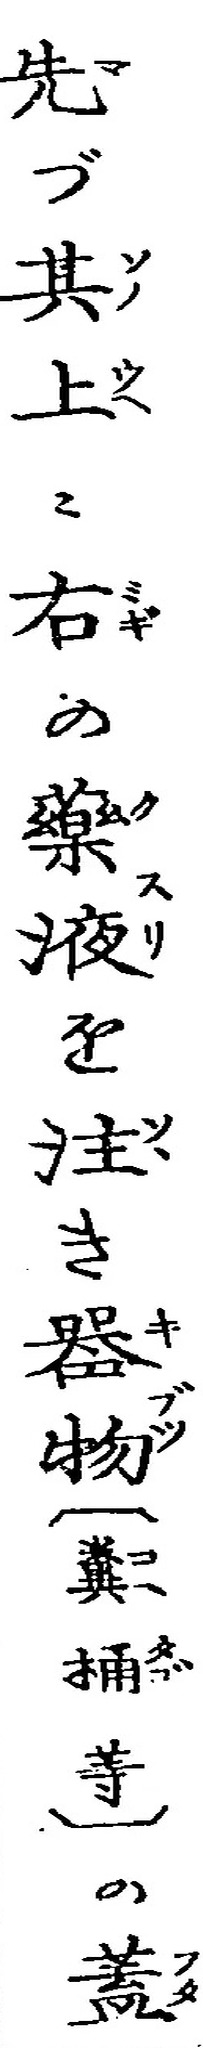先づ其上に右の薬液を注き器物[糞桶等]の蓋
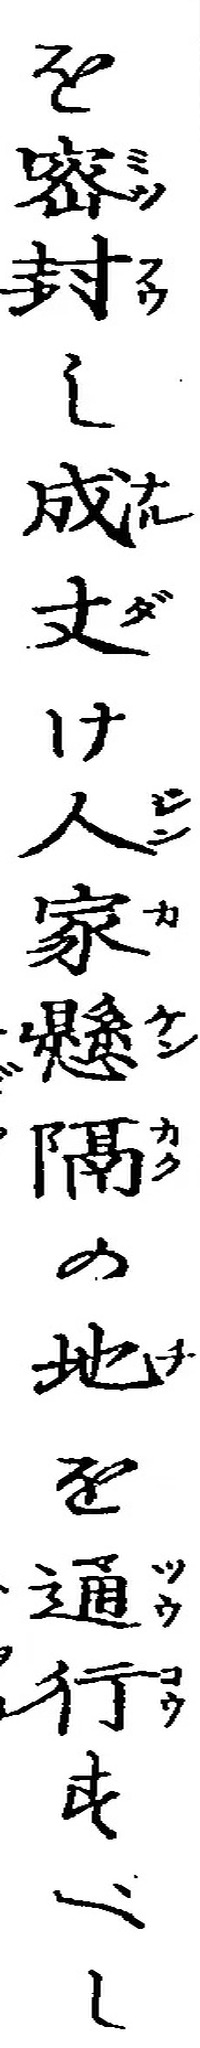を密封し成丈け人家懸隔の地を通行すべし
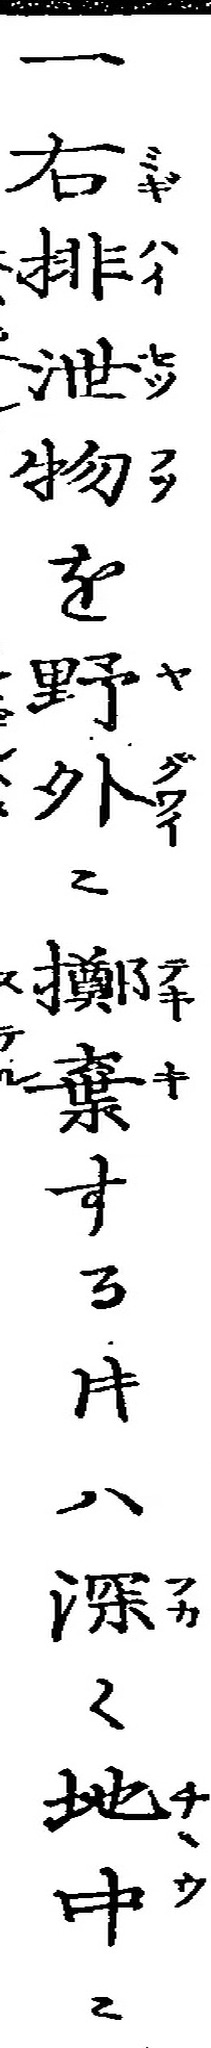一右排泄物を野外に擲棄するときは深く地中に
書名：伝染病予防法
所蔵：国立国会図書館 National Diet Library, JAPAN
